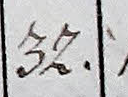32.
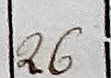26
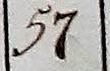57
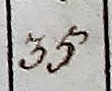35
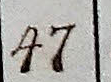47
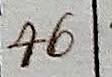46
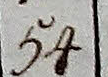54
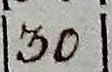30
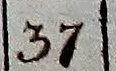37
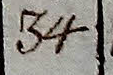34
